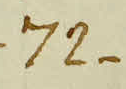72
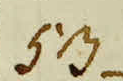53
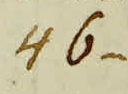46
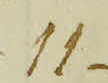11
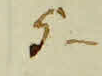5
